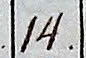14
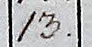13
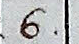6
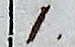1
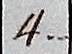4
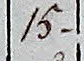15
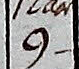9
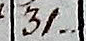31
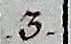3
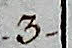3
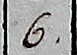6
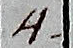4
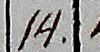14.
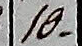10
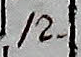12
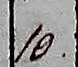10
